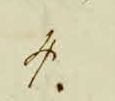4.
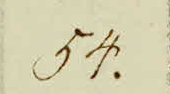54.
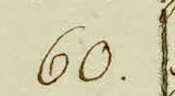60.
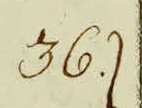36.
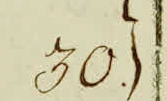30.
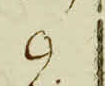9.
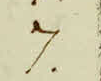7.
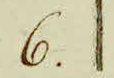6.
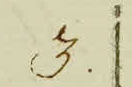3.
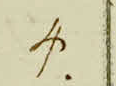4.
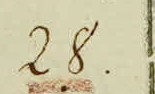28.
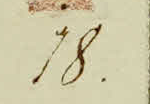18.
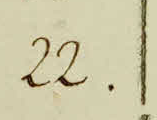22.
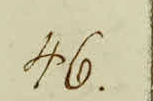46.
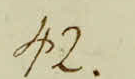42.
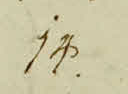14.
